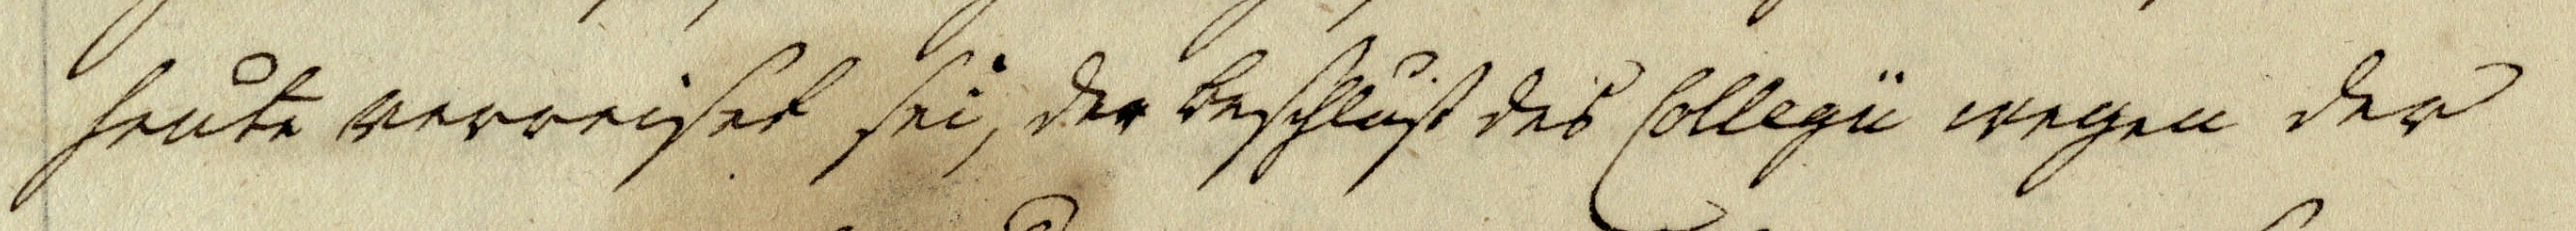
heute verreiset sei, der Beschluß des Collegii wegen der
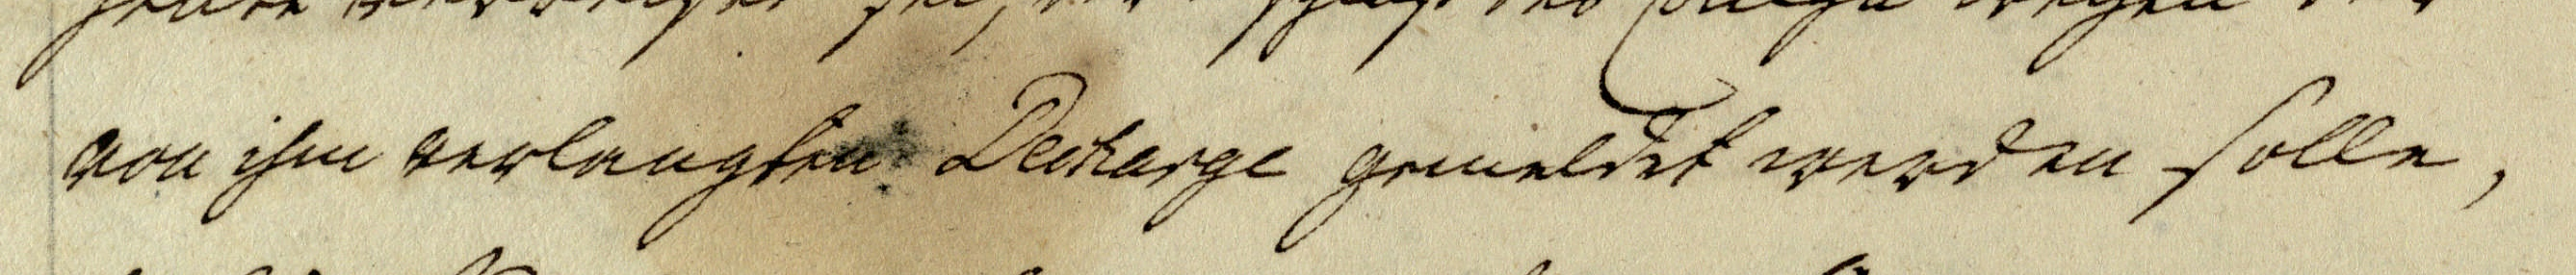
von ihm verlangten Decharge gemeldet werden solle,
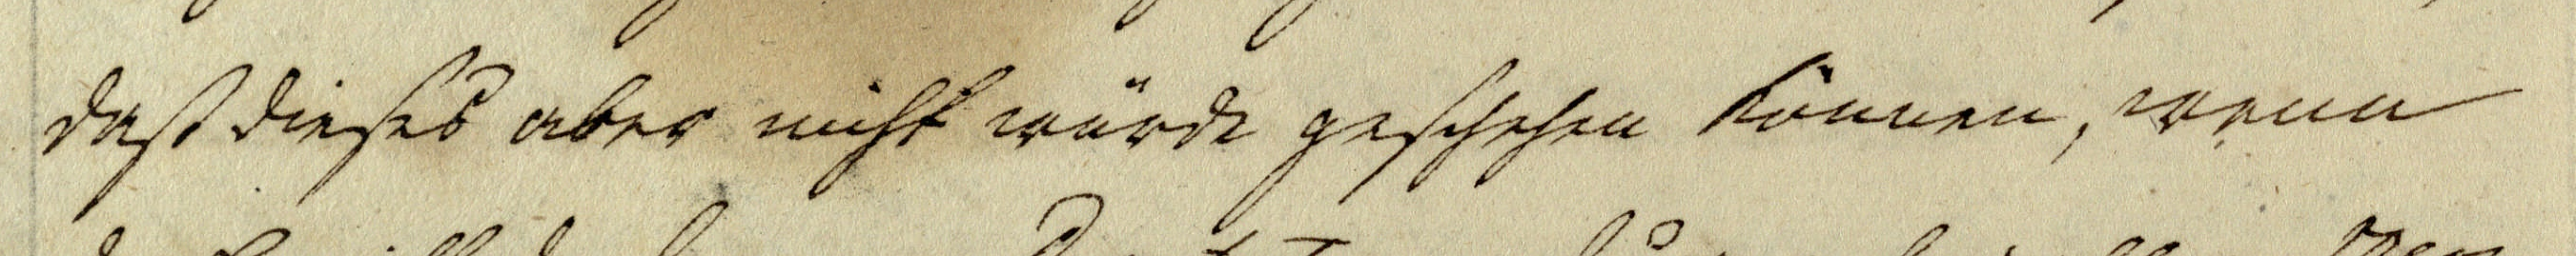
daß dieses aber nicht würde geschehen können, wenn
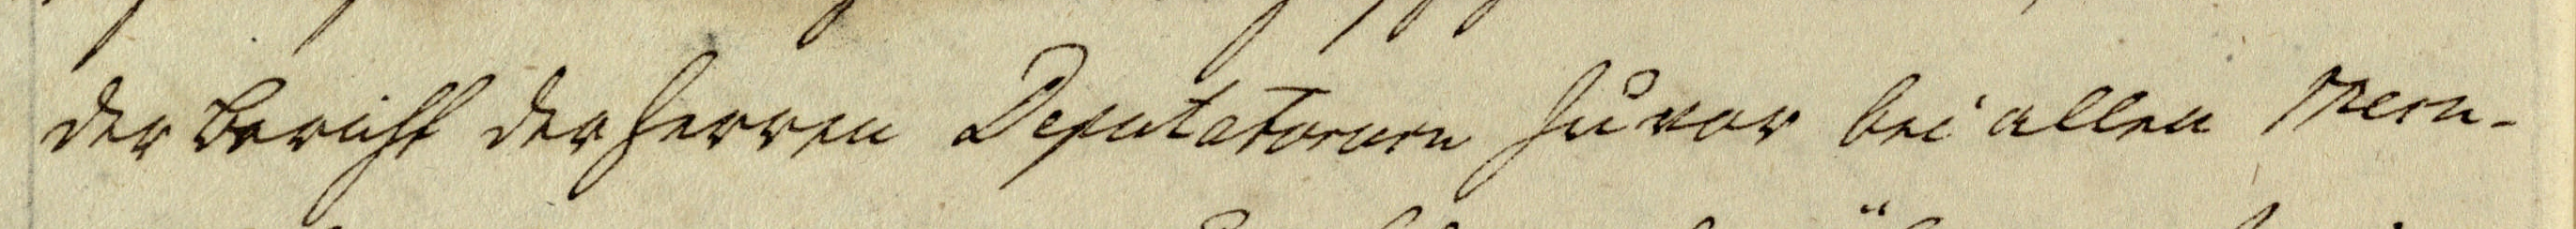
der Bericht der Herren Deputatorum zuvor bei allen Mem¬
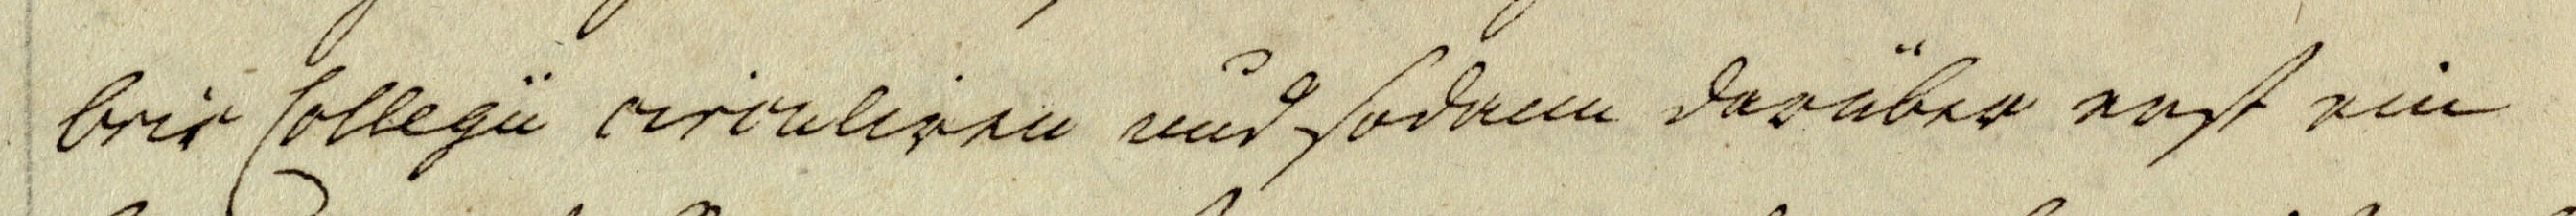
bris Collegii circuliren und sodann darüber erst ein
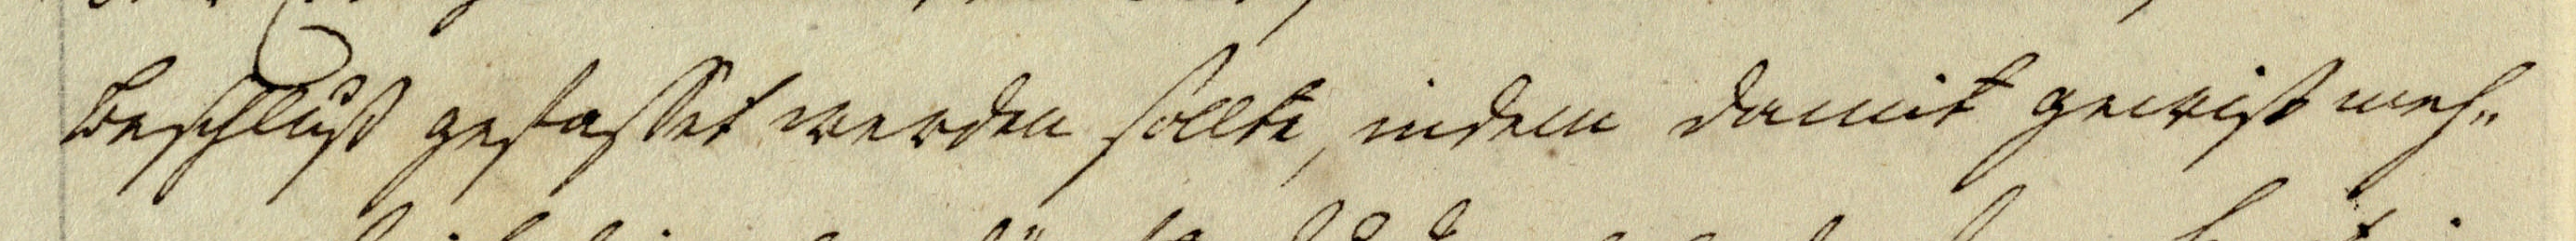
Beschluß gefasset werden sollte, indem damit gewiß meh¬
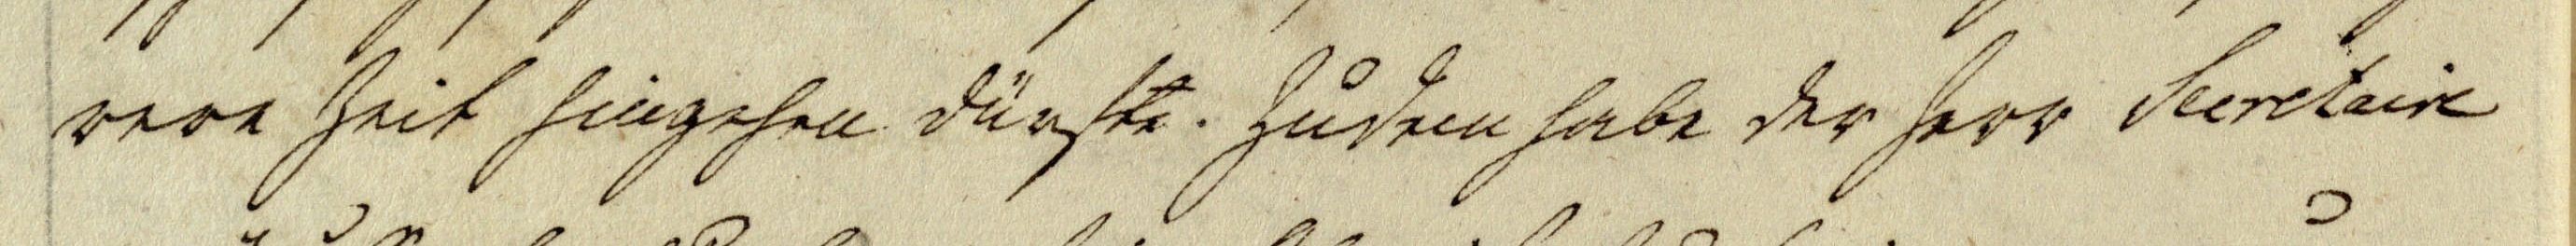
rere Zeit hingehen dürfte. Zudem habe der Herr Secretaire
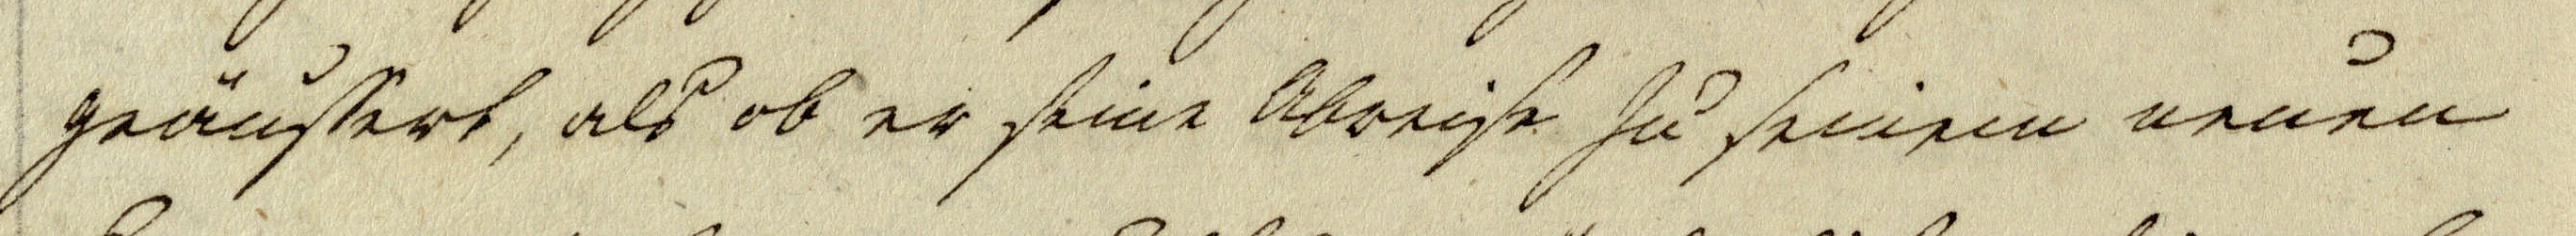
geäussert, als ob er seine Abreise zu seinem neuen
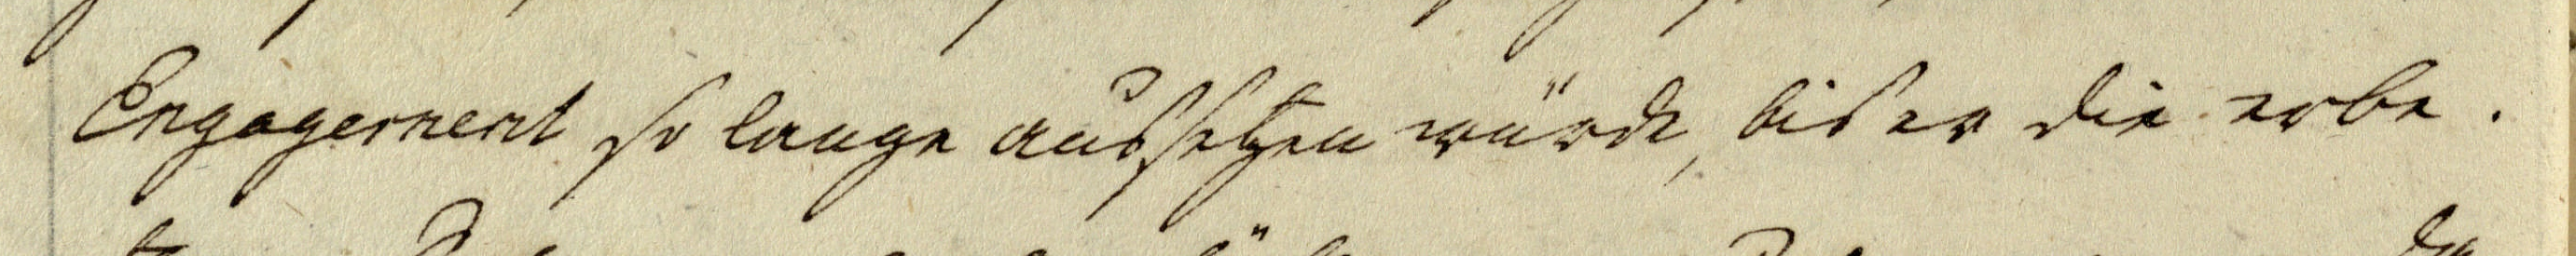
Engagement so lange aussetzen würde, bis er die erbe¬
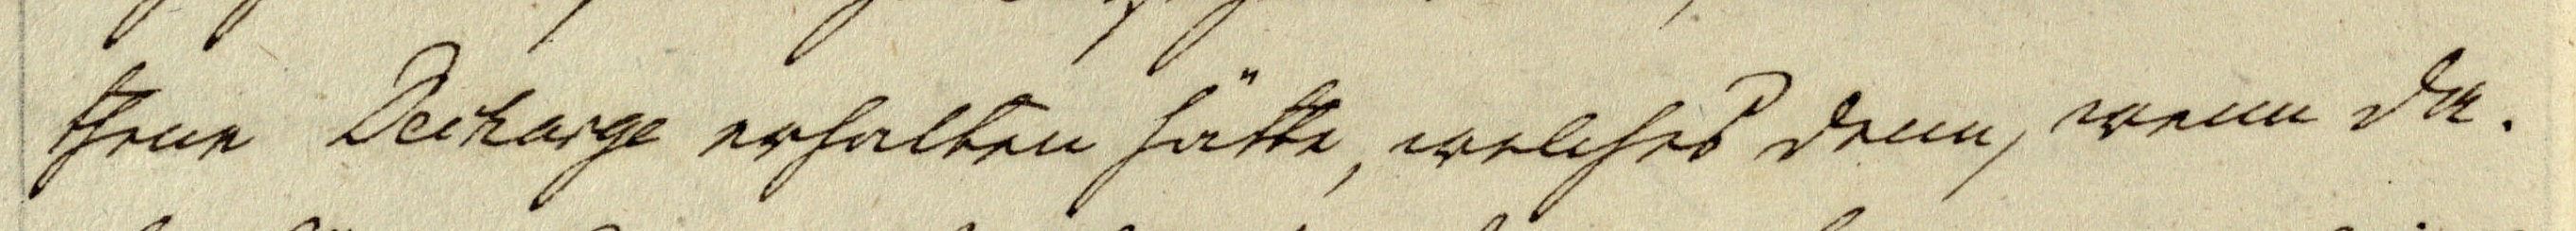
thene Decharge erhalten hätte, welches denn, wenn da¬
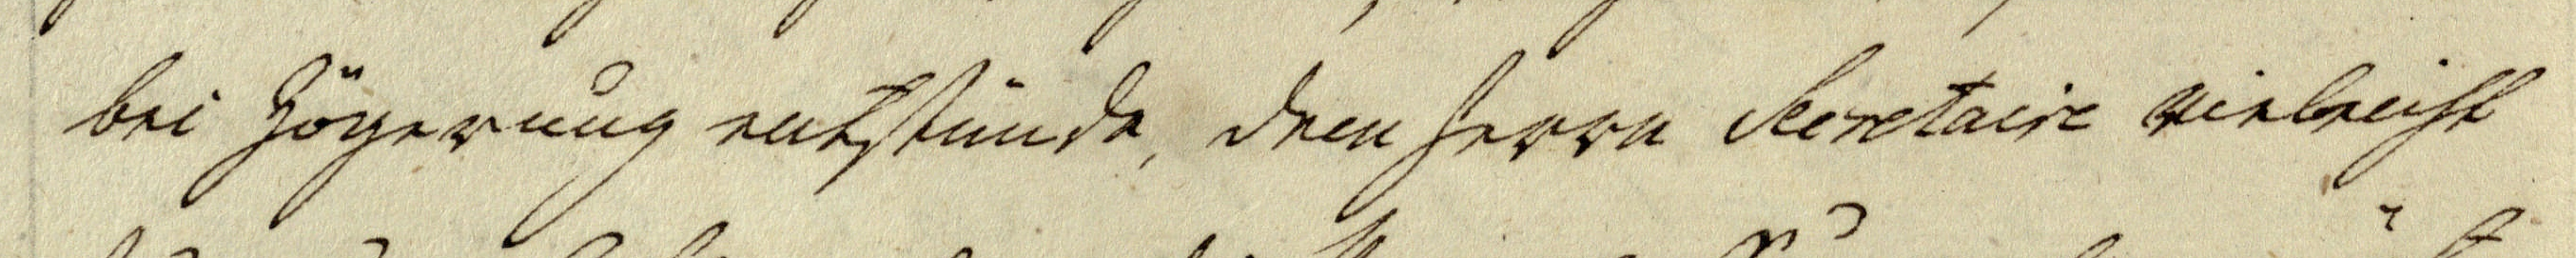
bei Zögerung entstünde, dem Herrn Secretaire vieleicht
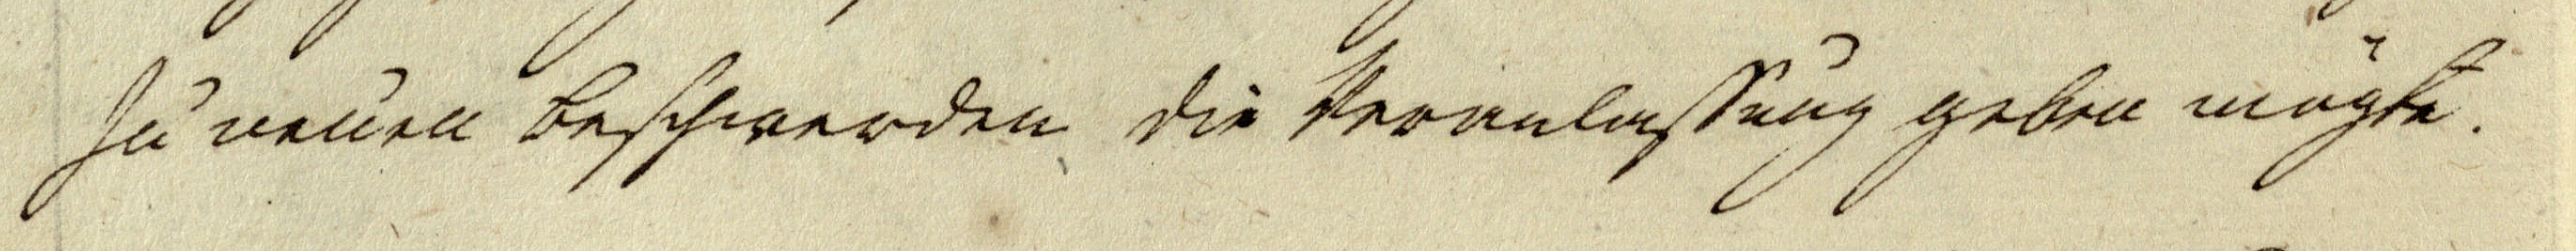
zu neuen Beschwerden die Veranlassung geben mögte.
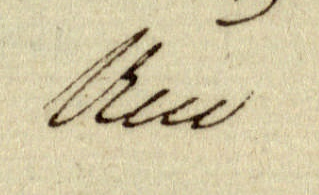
Um
